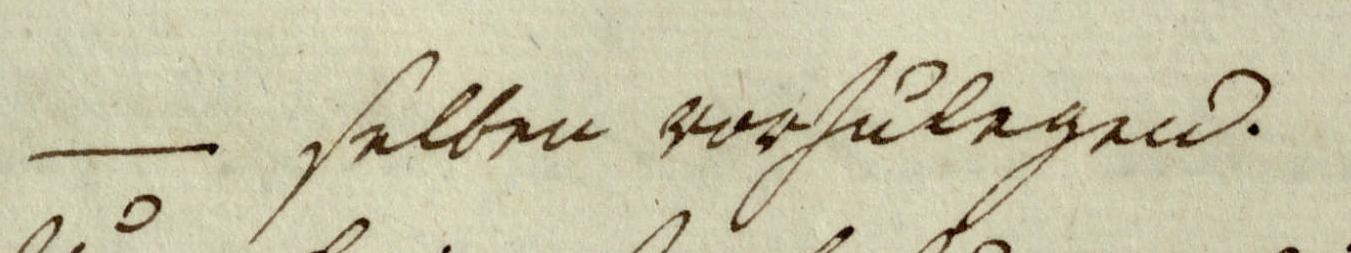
selben vorzulegen.
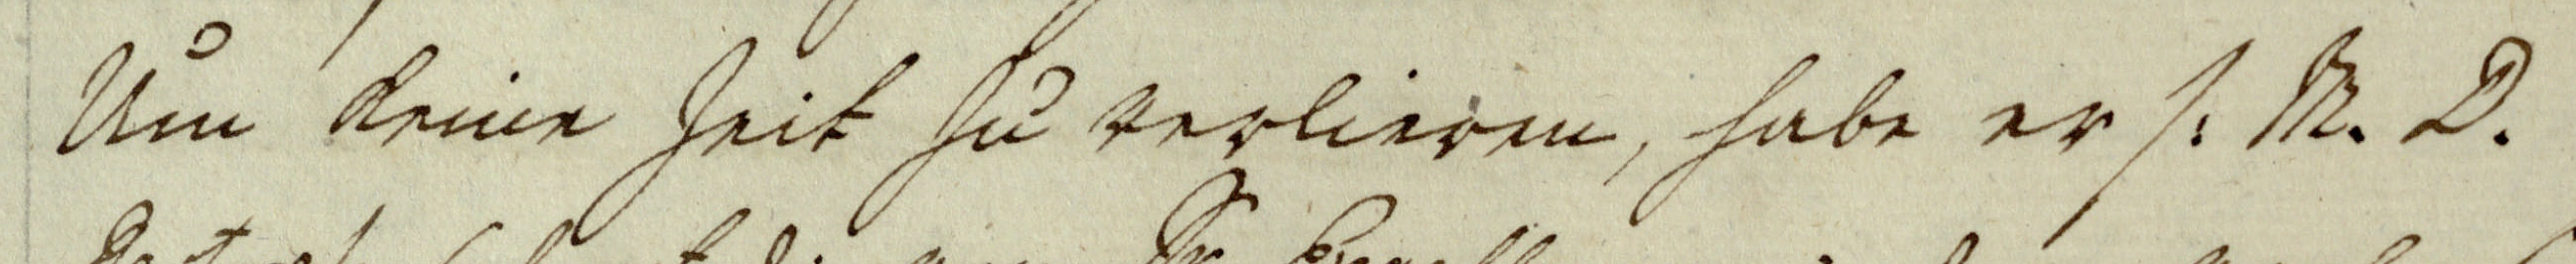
Um keine Zeit zu verlieren, habe er /:M. D.
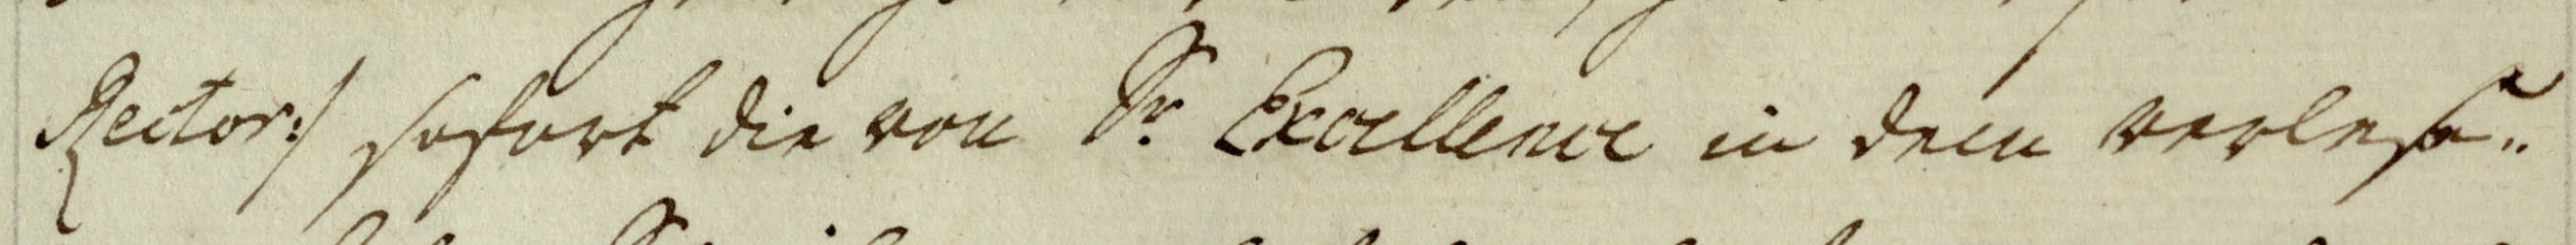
Rector :/ sofort die von Sr Excellence in dem verlese¬
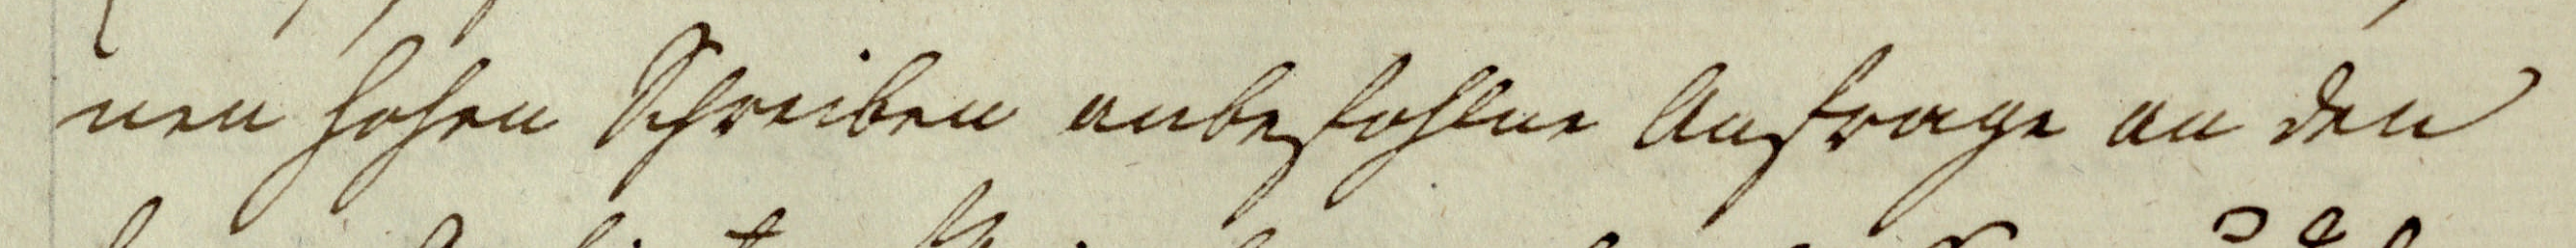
nen hohen Schreiben anbefohlne Anfrage an den
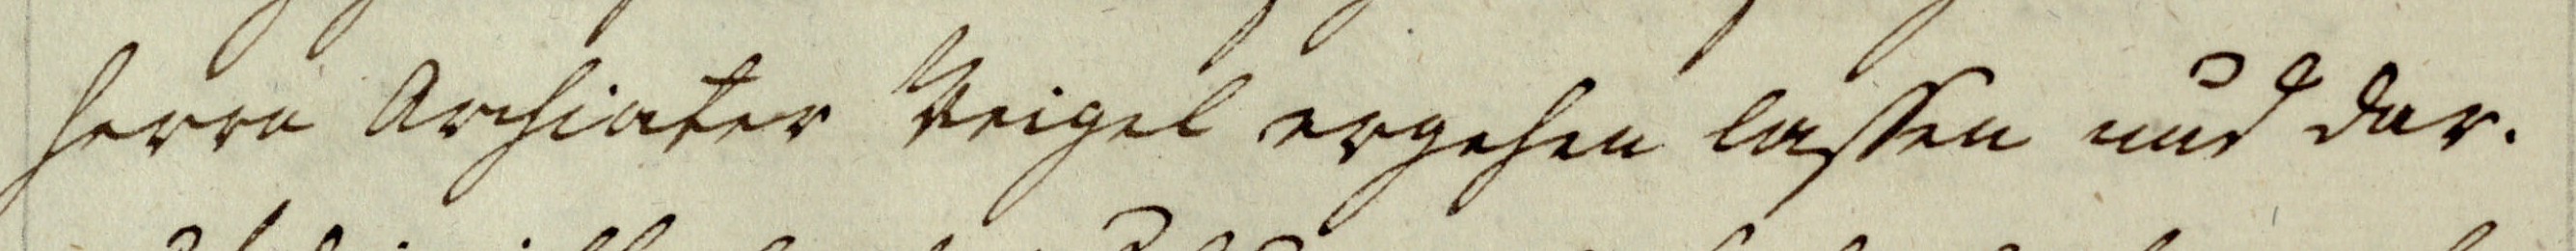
Herrn Archiater Weigel ergehen lassen und dar¬
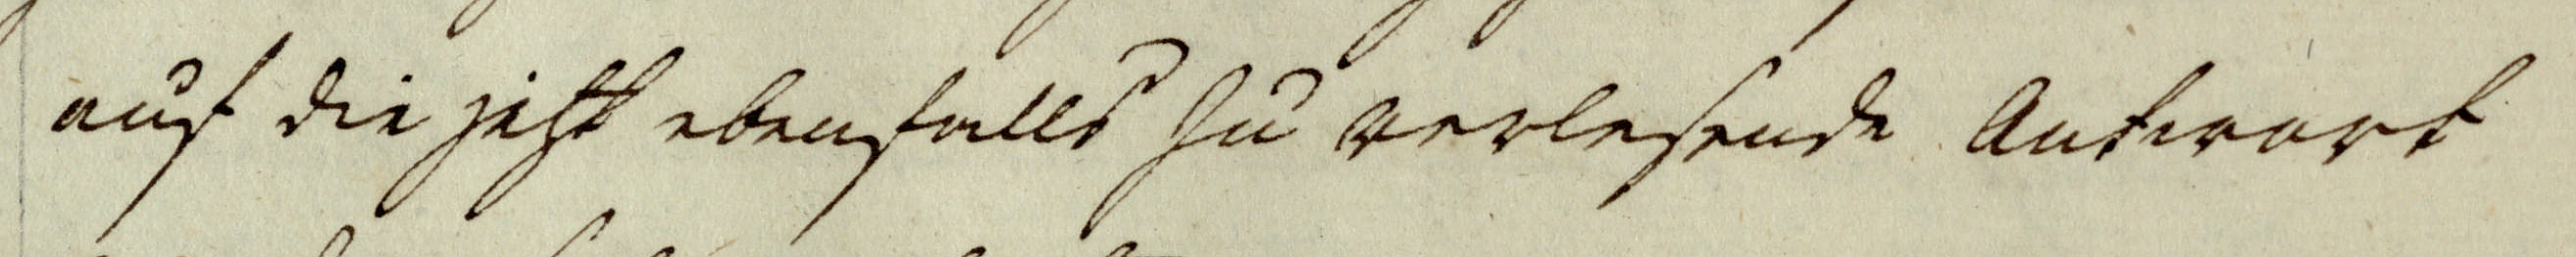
auf die jetzt ebenfalls zu verlesende Antwort
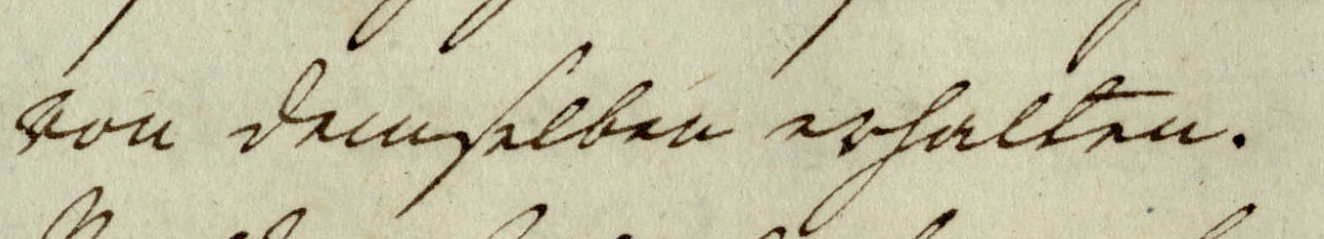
von demselben erhalten.
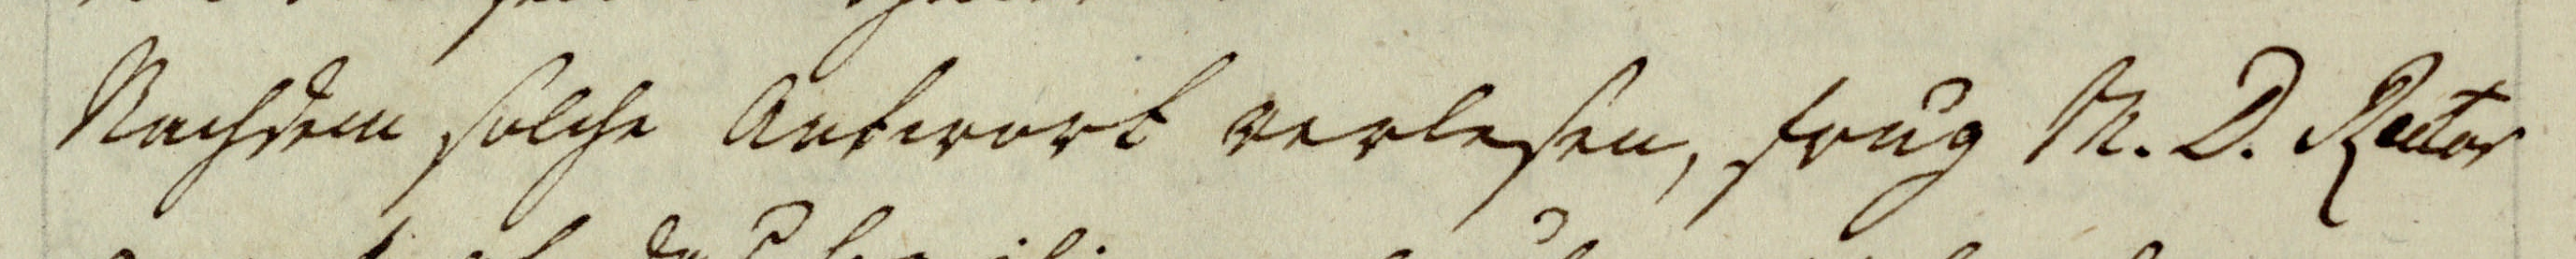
Nachdem solche Antwort verlesen, frug M. D. Rector
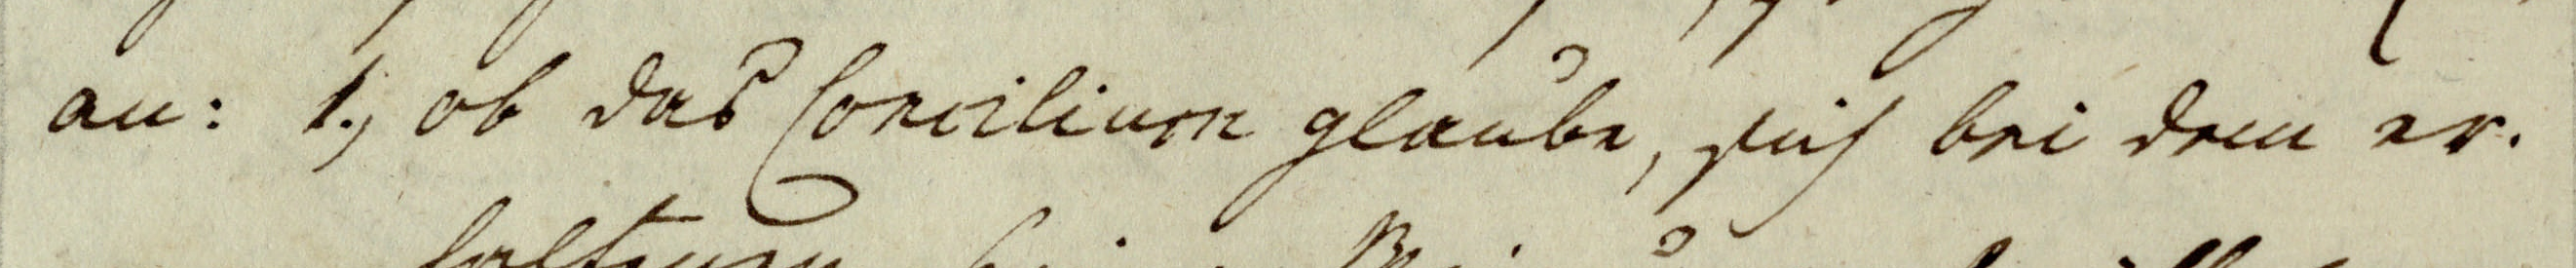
an: 1., ob das Concilium glaube, sich bei dem er¬
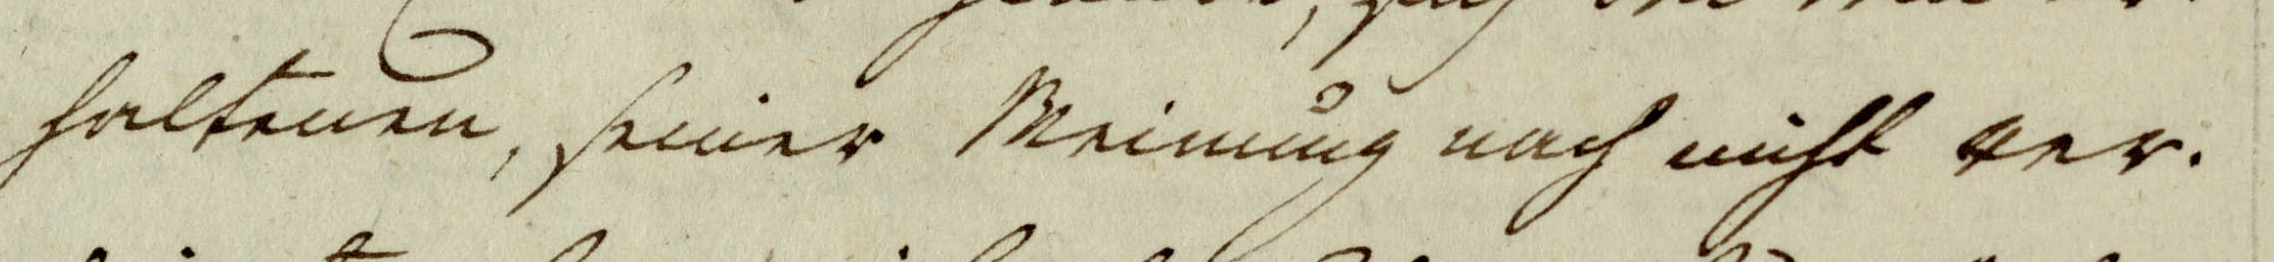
haltenen, seiner Meinung nach nicht ver¬
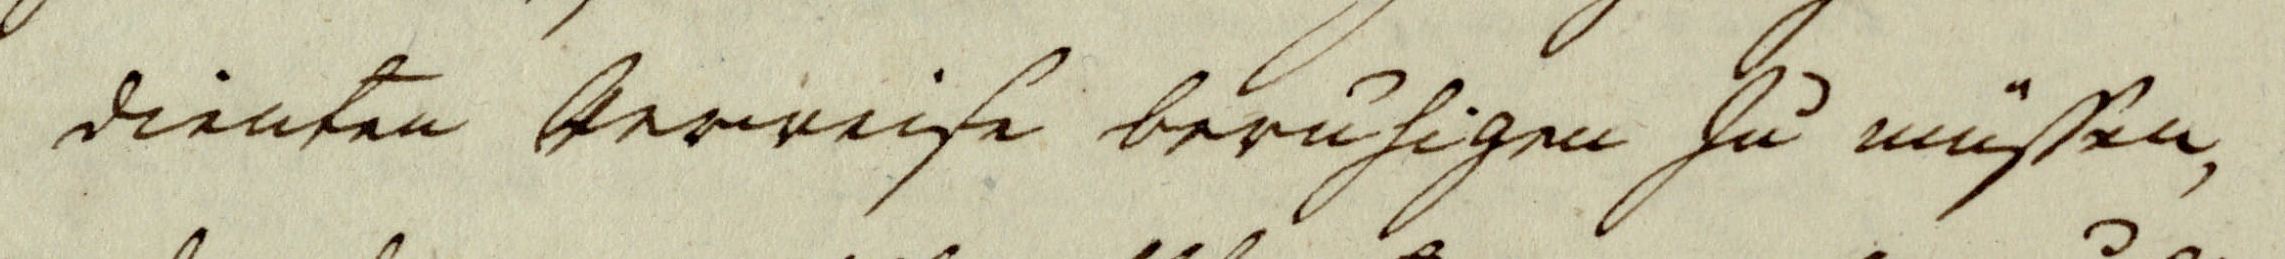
dienten Verweise beruhigen zu müssen,
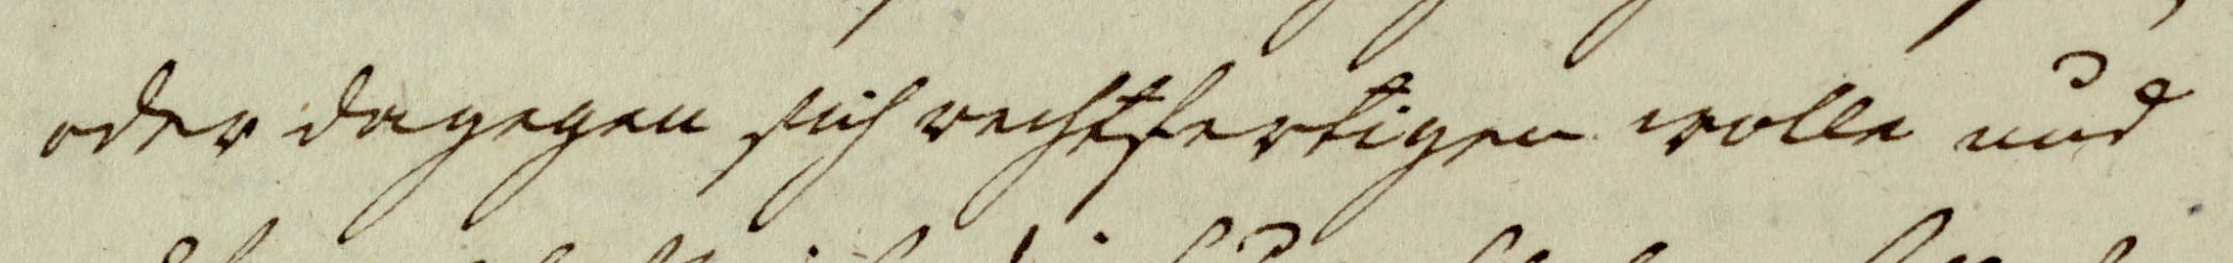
oder dagegen sich wechtfertigen wolle und
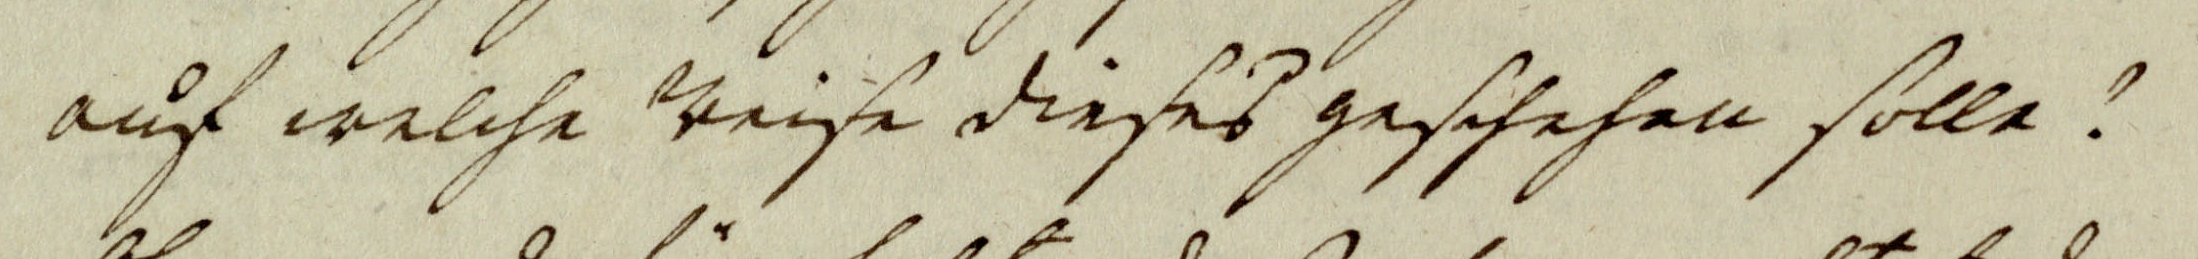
auf welche Weise dieses geschehen solle?
